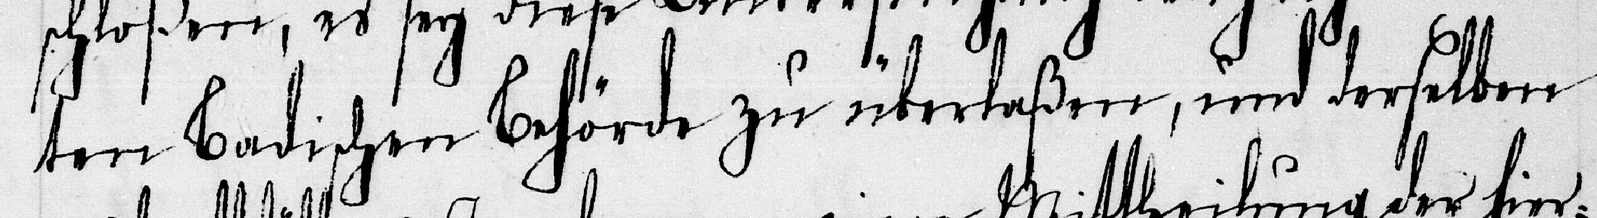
ten Badischen Behörde zu überlaßen, und derselben
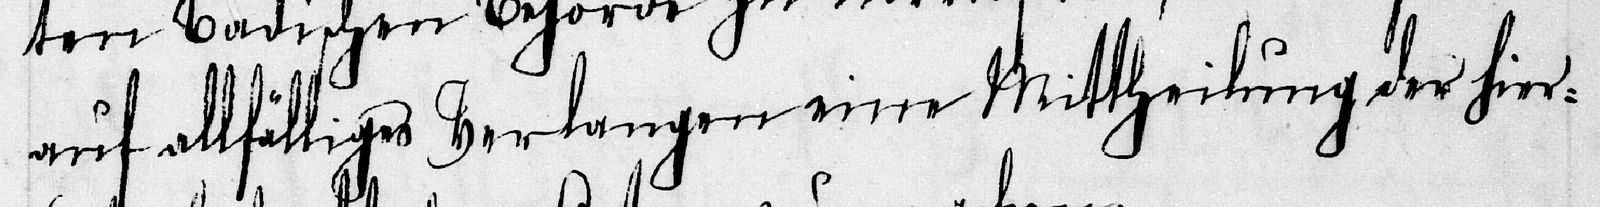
auf allfälliges Verlangen eine Mittheilung der hier¬
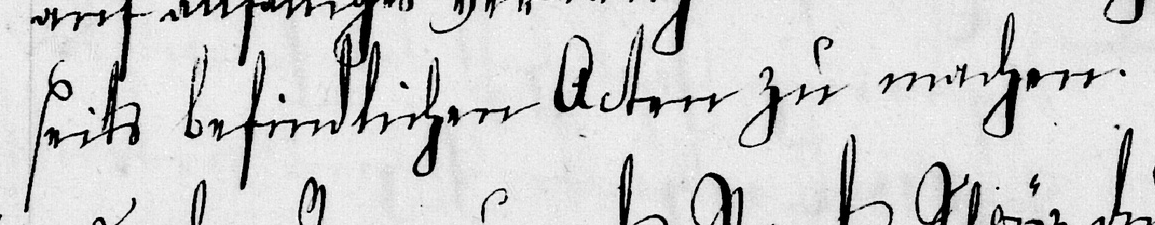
seits befindlichen Acten zu machen.
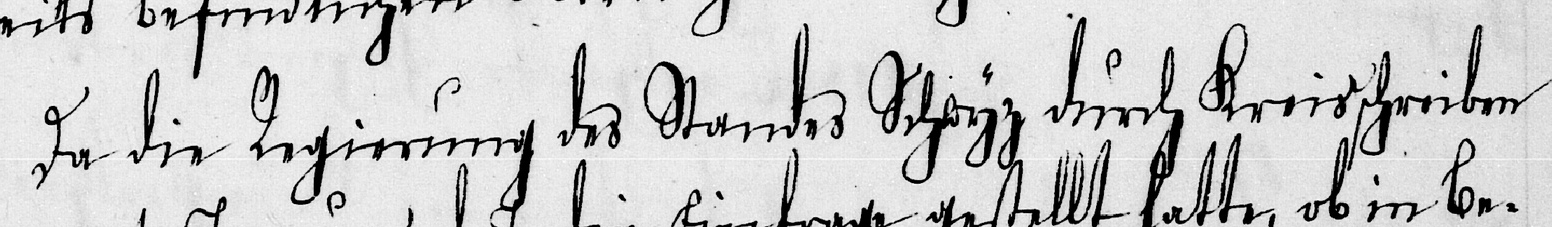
Da die Regierung des Standes Schwyz durch Kreisschreib¬
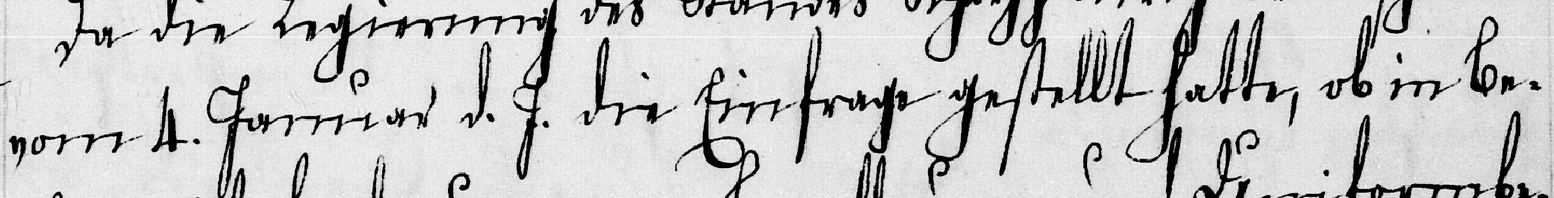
vom 4. Januar d. J. die Einfrage gestellt hatte, ob in Be¬
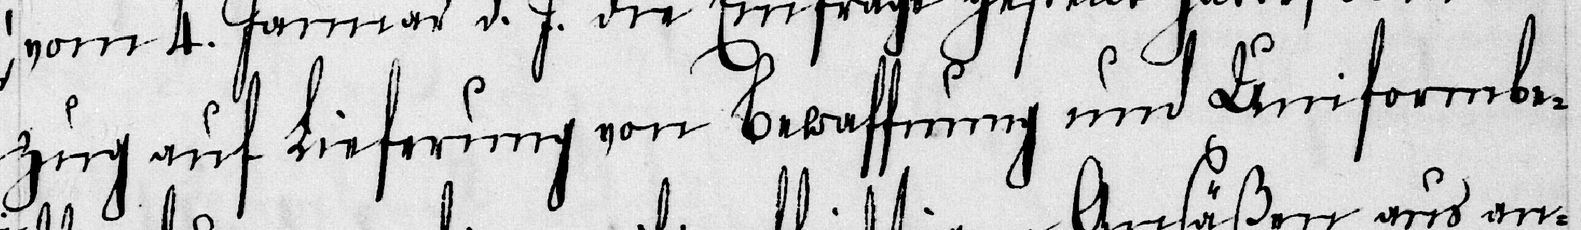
zug auf Lieferung von Bewaffnung und Uniformbe¬
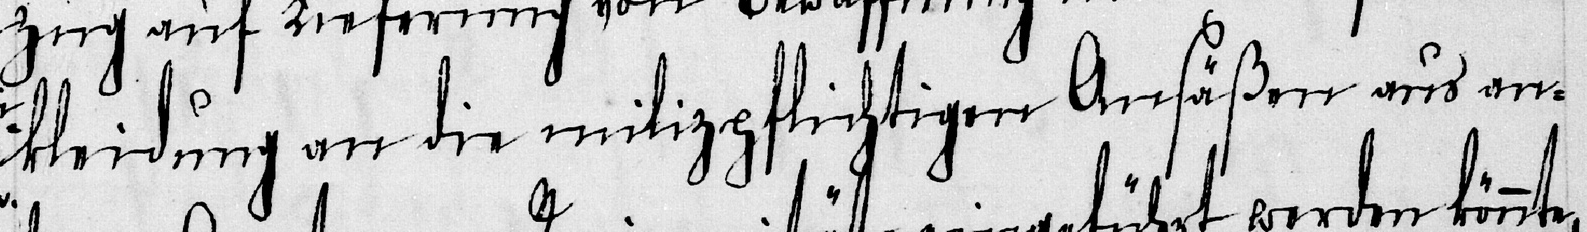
kleidung an die milizpflichtigen Ansäßen aus an¬
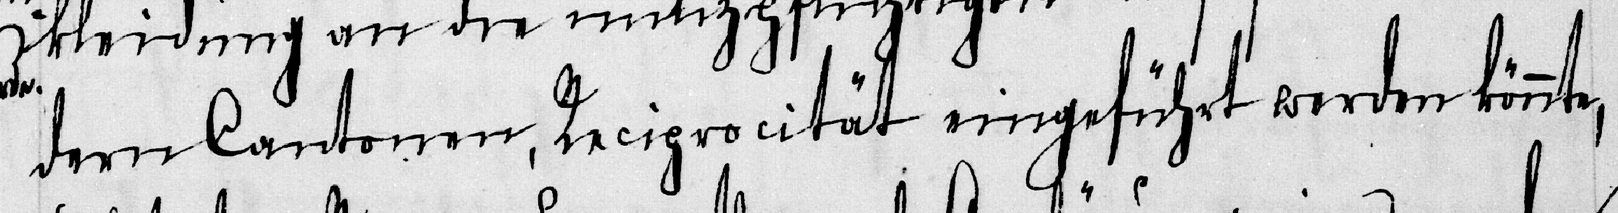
dern Cantonen, Reciprocität eingeführt werden könnt¬
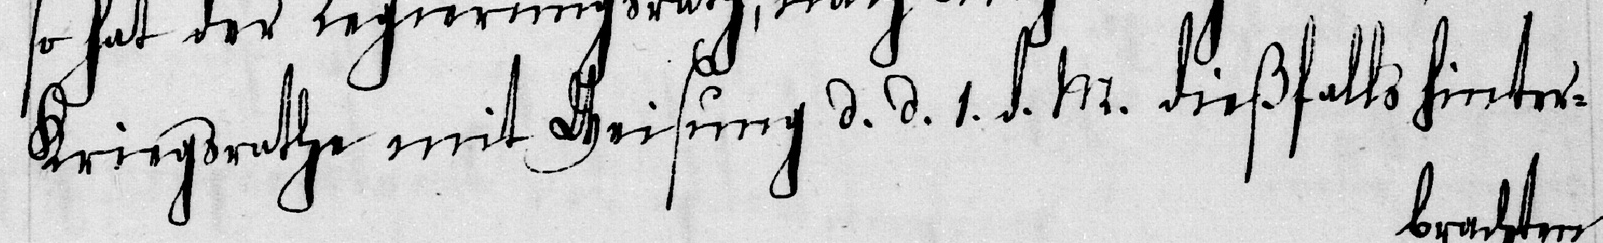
Kriegsrathe mit Weisung d. d. 1. d. M. dießfalls hinter-
